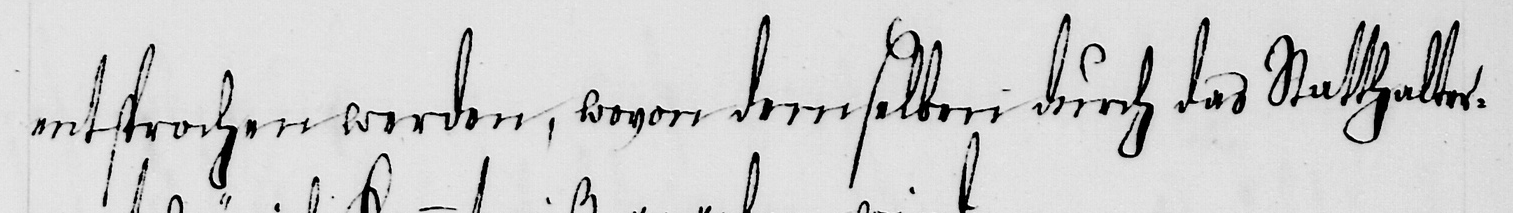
entsprochen werden, wovon demselben durch das Statthalter¬
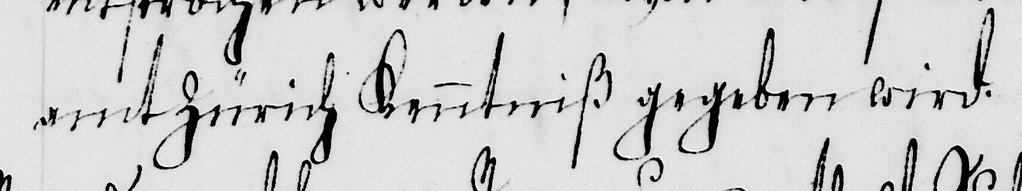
amt Zürich Kenntniß gegeben wird.
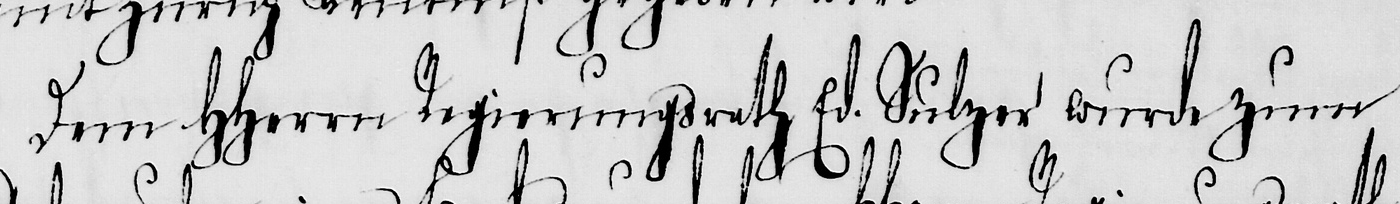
Dem HHerrn Regierungsrath Ed. Sulzer wurde zum
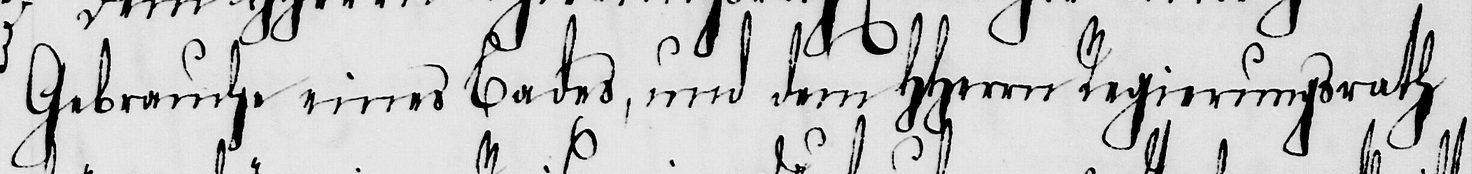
Gebrauche eines Bades, und dem HHerrn Regierungsrath
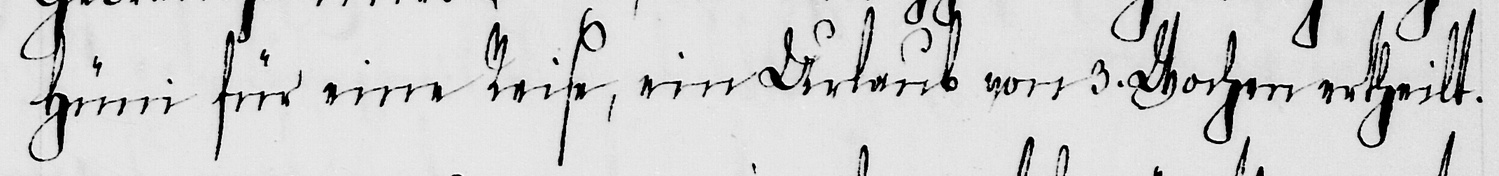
Hüni für eine Reise, ein Urlaub von 3. Wochen ertheilt.
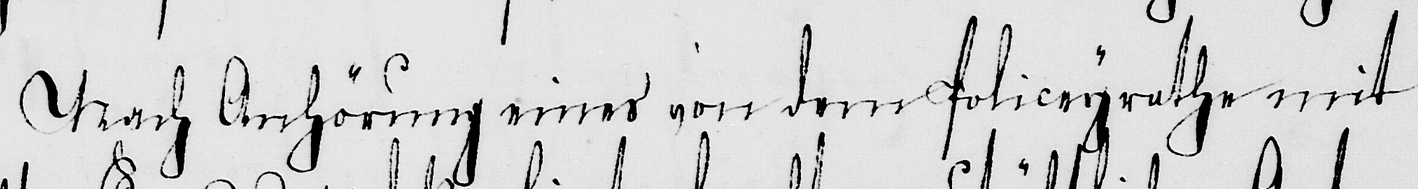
Nach Anhörung eines von dem Policeyrathe mit
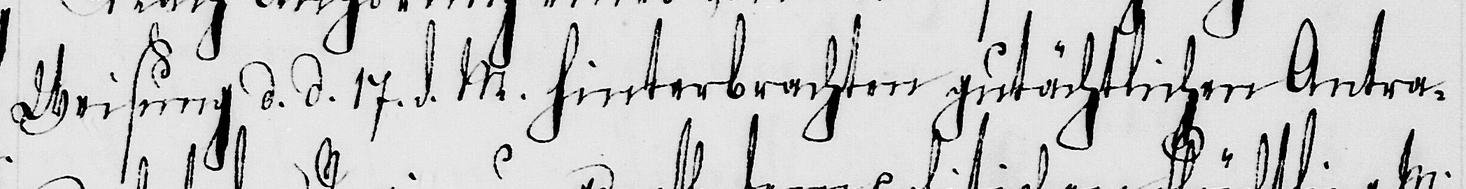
Weisung d. d. 17. d. M. hinterbrachten gutächtlichen Antra¬
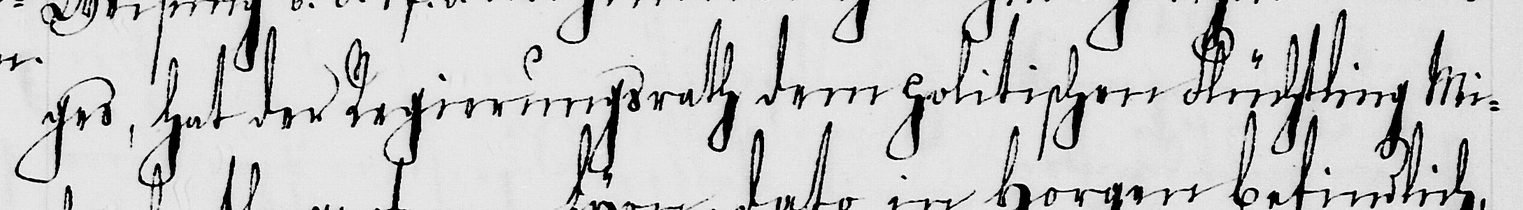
ges, hat der Regierungsrath dem politischen Flüchtling Mi¬
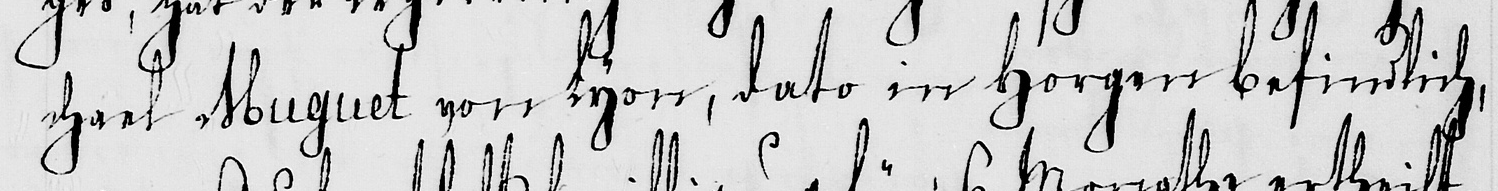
chael Muguet von Lyon, dato in Horgen befindlich,
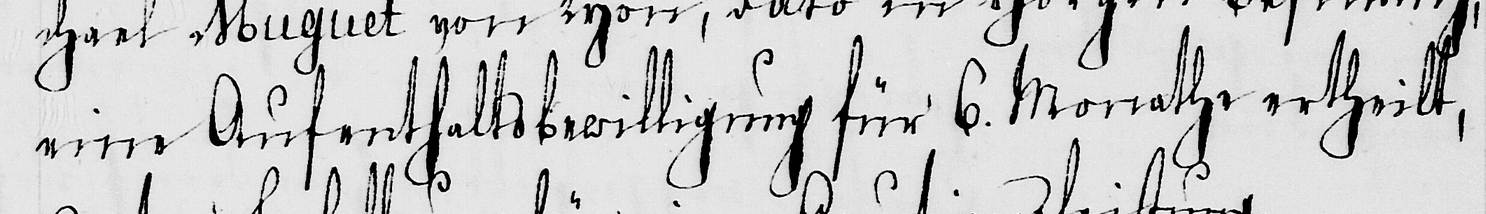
eine Aufenthaltsbewilligung für 6. Monathe ertheilt,
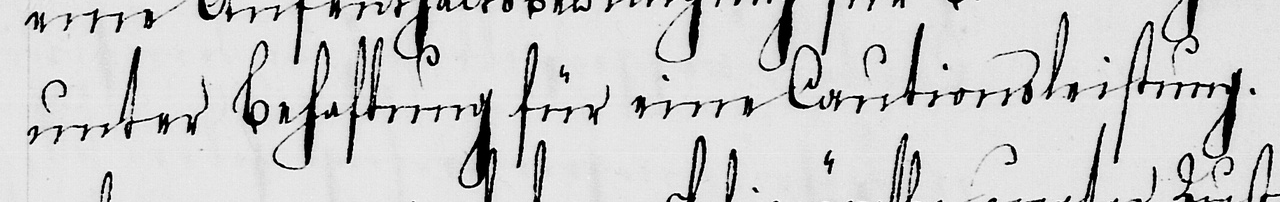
unter Behaftung für eine Cautionsleistung.
